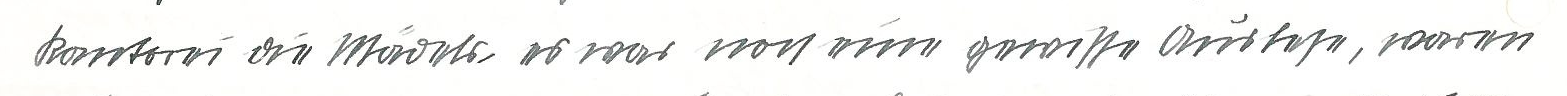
Kantorei die Mädels, es war noch eine gewisse Auslese, waren
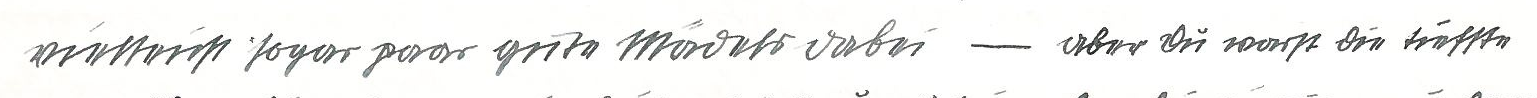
vielleicht sogar paar gute Mädels dabei – aber Du warst die tiefste
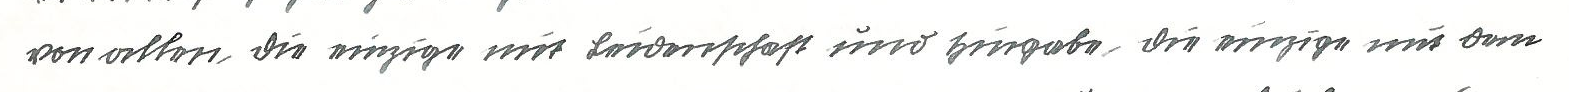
von allen, die einzige mit Leidenschaft und Hingabe, die einzige mit dem
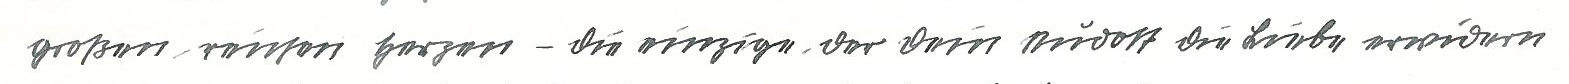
großem, reichen Herzen – die einzige, der Dein Roland die Liebe erwidern
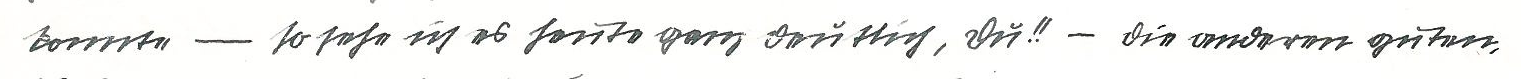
konnte – so sehe ich es heute ganz deutlich, Du!! – Die anderen guten
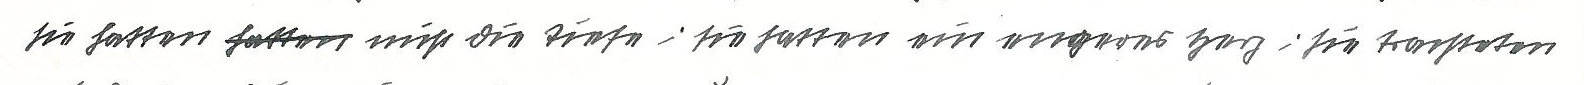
sie hatten hatten nicht die Tiefe; sie hatten ein engeres Herz; sie trachteten
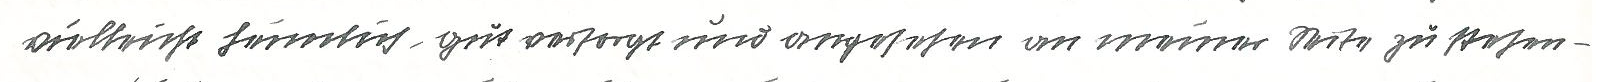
vielleicht heimlich, gut versorgt und angesehen an meiner Seite zu stehen –
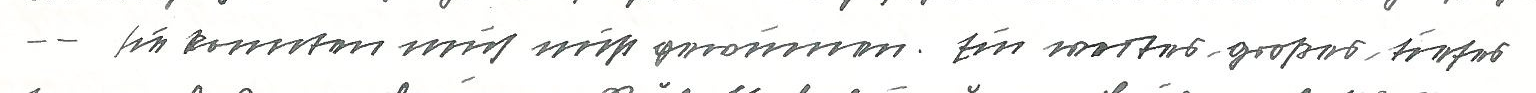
– – sie konnten mich nicht gewinnen. Ein weites, großes, tiefes
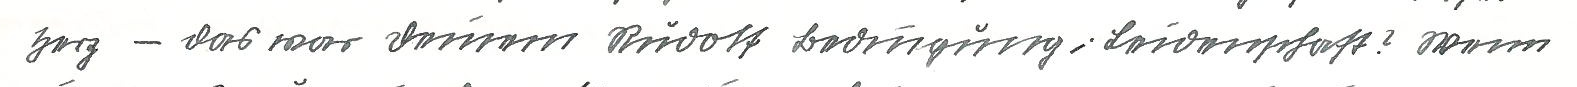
Herz – das war Deinem Roland Bedingung, – Leidenschaft? Wenn
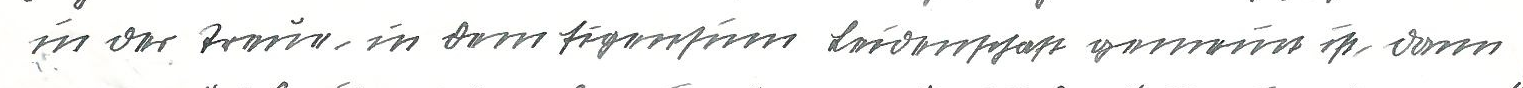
in der Treue, in dem Eigensinn Leidenschaft gemeint ist, dann
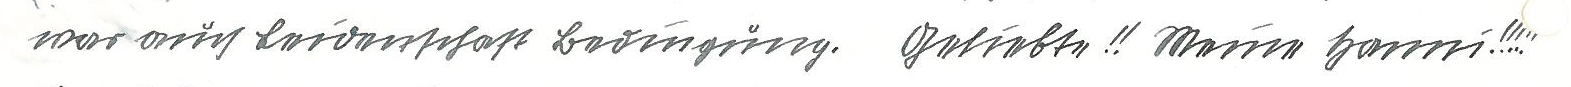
war auch Leidenschaft Bedingung. Geliebte!! Meine Hilde!!!!!
